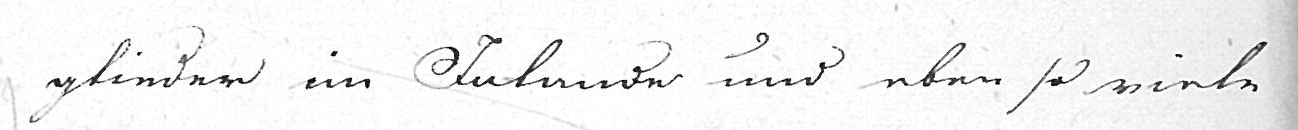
glieder im Inlande und eben so viele
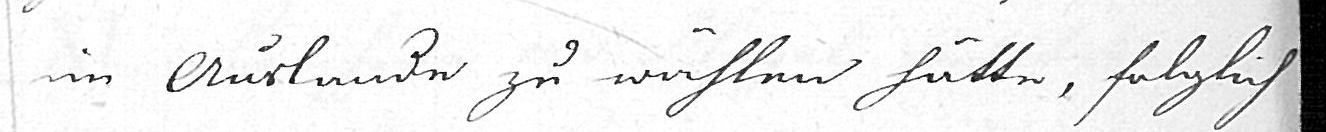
im Auslande zu wählen hätte, folglich
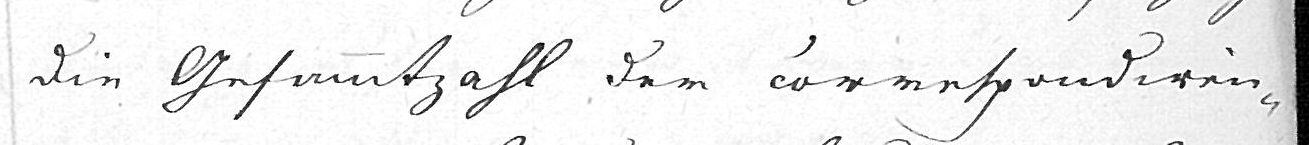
die Gesammtzahl der correspondiren-
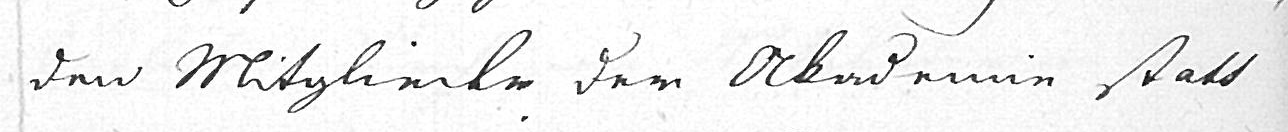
den Mitglieder der Akademie statt
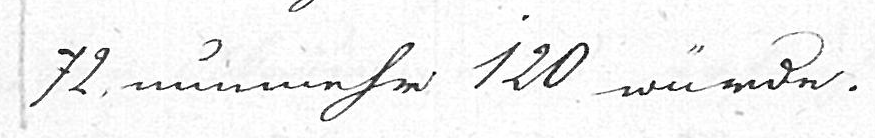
72 nunmehr 120 würde.
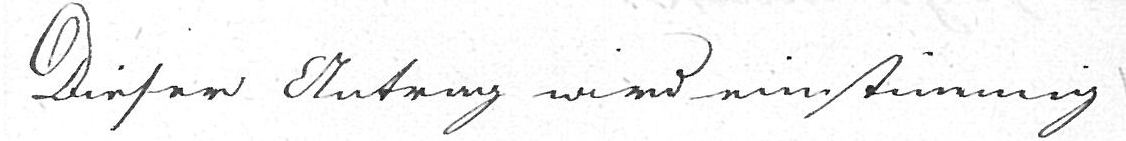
Dieser Antrag wird einstimmig
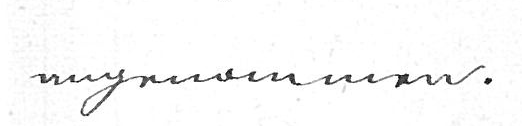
angenommen.
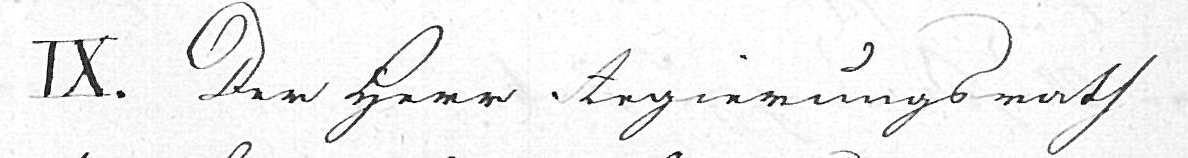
IX. Der Herr Regierungsrath
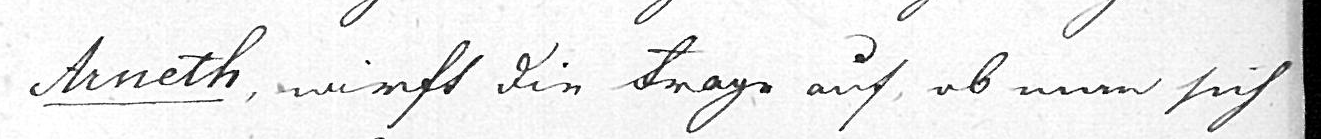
Arneth wirft die Frage auf, ob man sich
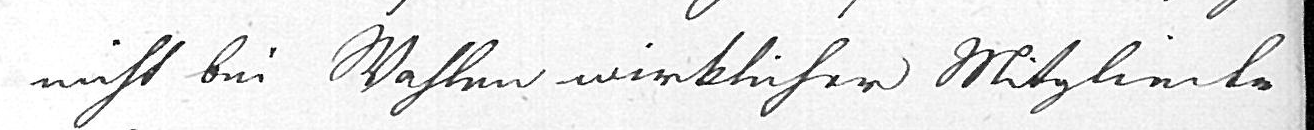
nicht bei Wahlen wirklicher Mitglieder
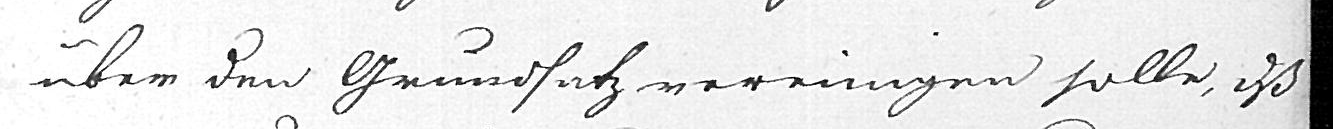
über den Grundsatz vereinigen solle, daß
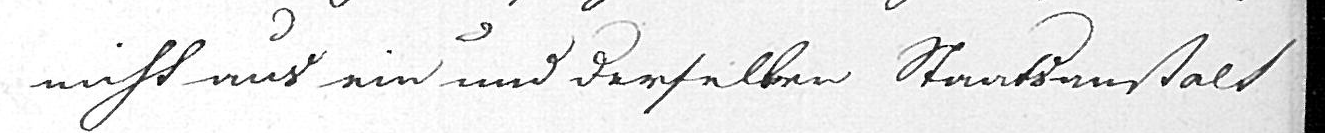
nicht aus ein und derselben Staatsanstalt
